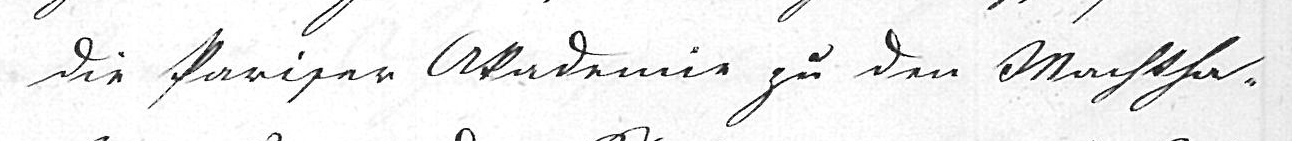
die Pariser Akademie zu den Machtha-
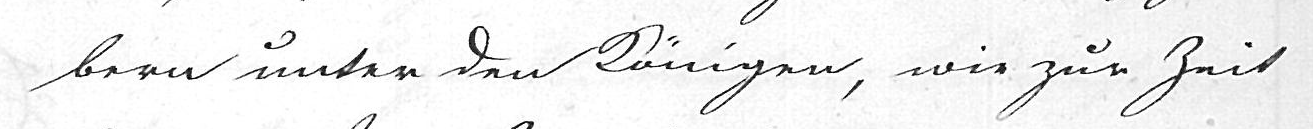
bern unter den Königen, wir zur Zeit
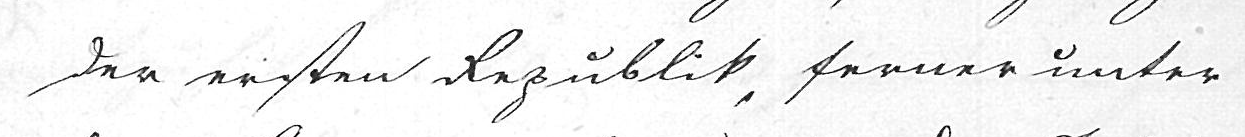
der ersten Republik, ferner unter
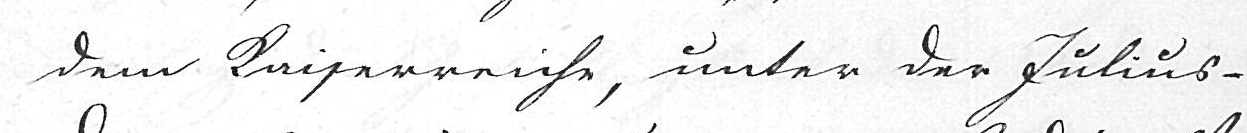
dem Kaiserreiche, unter der Julius-
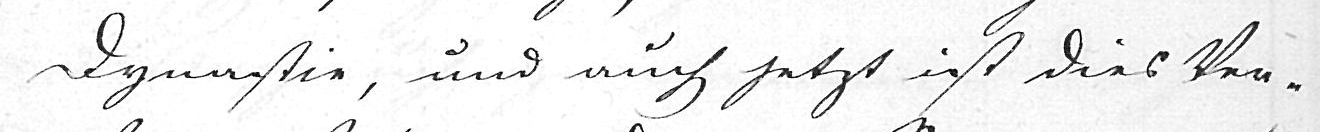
Dynastie, und auch jetzt ist dies Ver-
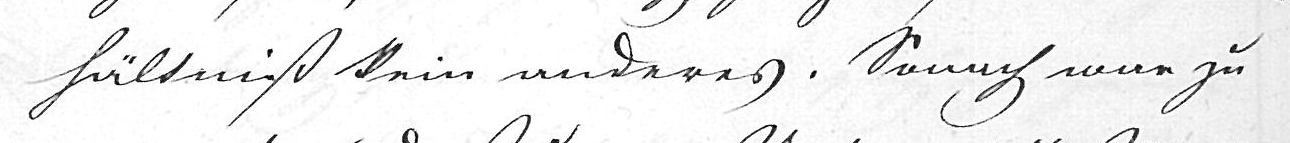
hältniß kein anderes. Sonach war zu
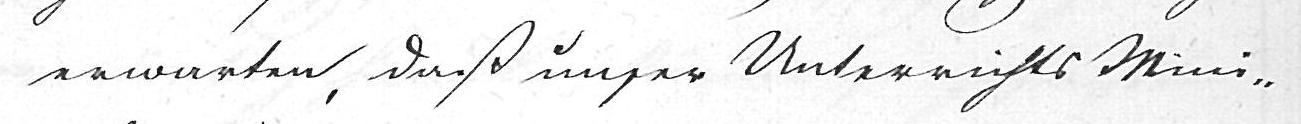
erwarten, daß unser Unterrichts-Mini-
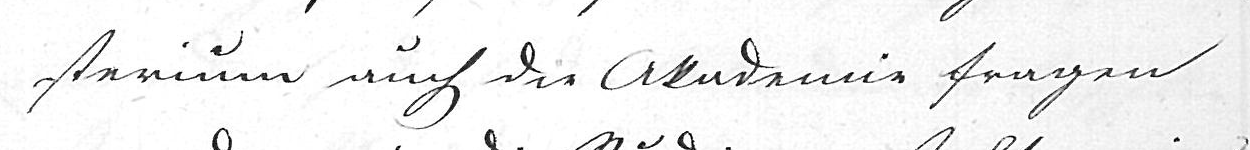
sterium auch der Akademie fragen
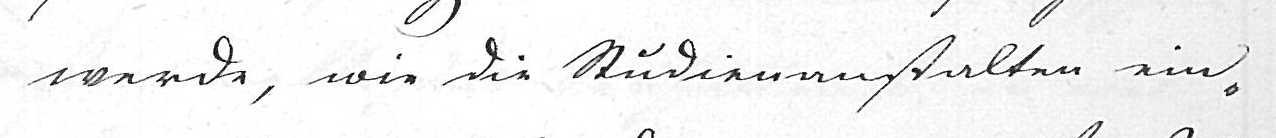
werde, wir die Studienanstalten ein-
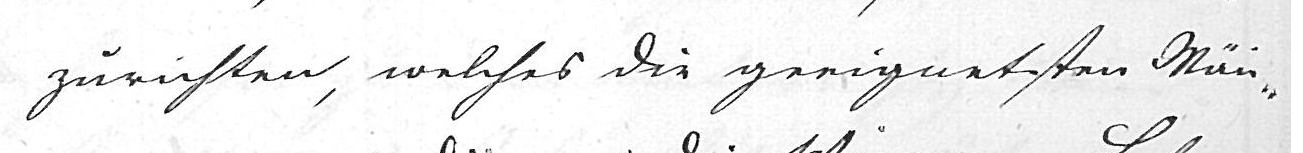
zurichten, welches die geeignetsten Män-
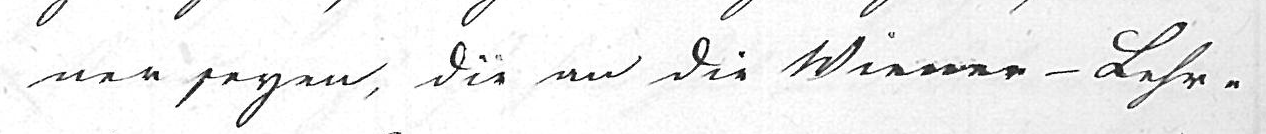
ner seyen, die an die Wiener-Lehr-
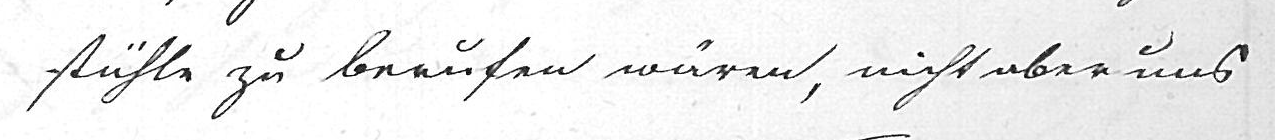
stühle zu berufen wären, nicht aber uns
